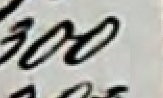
300
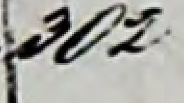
302
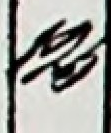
125
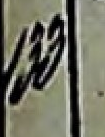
133
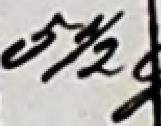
5 1/2
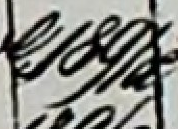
189/a
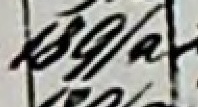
189/a
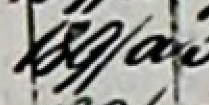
189/a
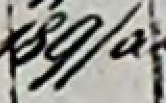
189/a
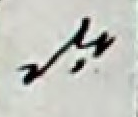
Do
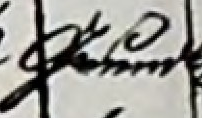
Grundt
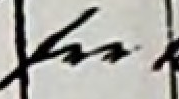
see
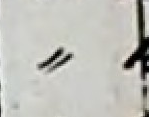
„
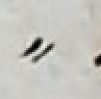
„
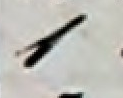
1
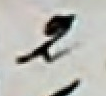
2
